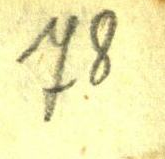78
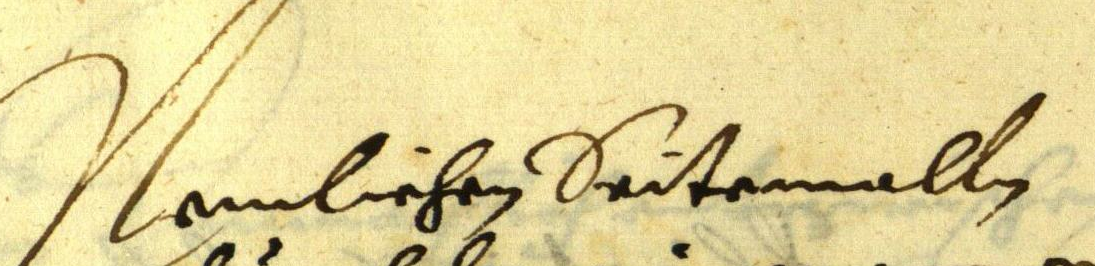Nemlichen Seitenmalln
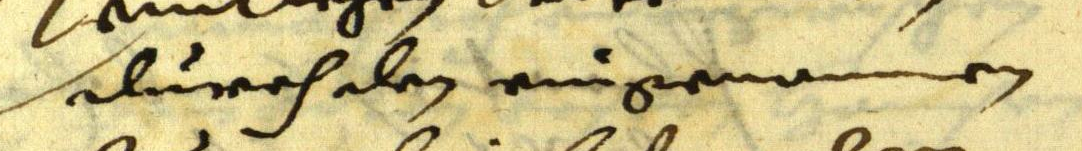dūrch den eingenommen
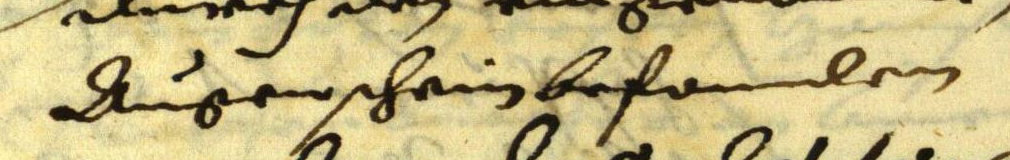Aūgenschein befonnden
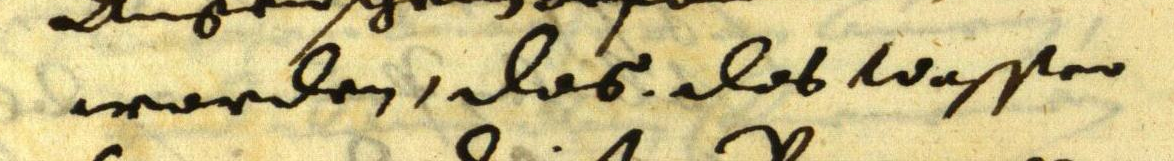worden, das. das Wasser
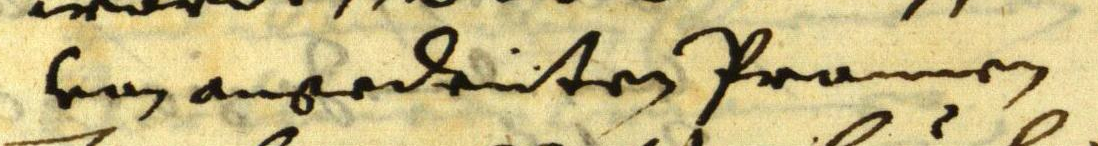von angedeüten Pronnen
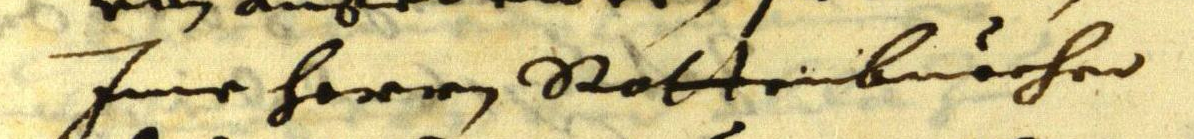Ime herrn Rottenbūecher
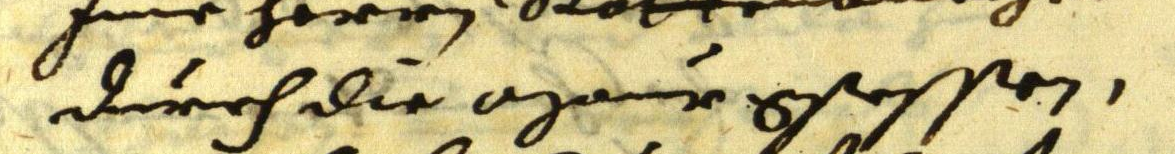dūrch die Maūr gsessen,
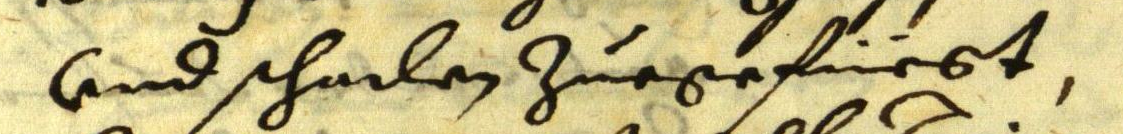vnd schaden Zūegefüegt,
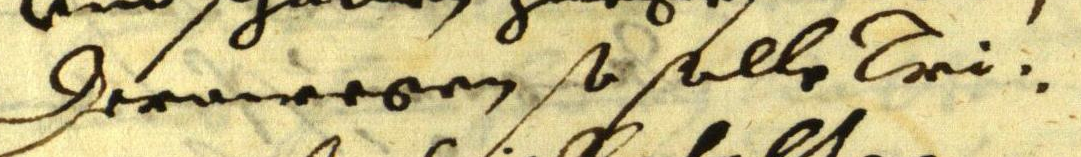Derowegen so solle Tri¬
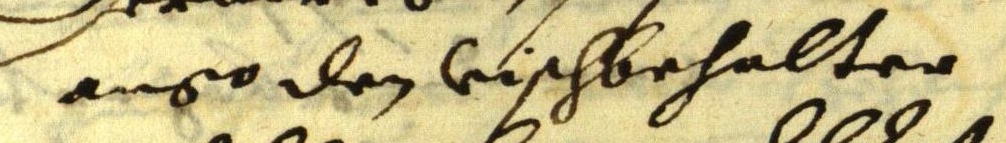ango den vischbehalter
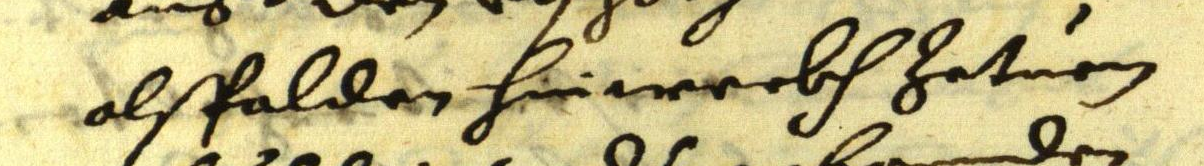alspalden hinweckh Zetūen
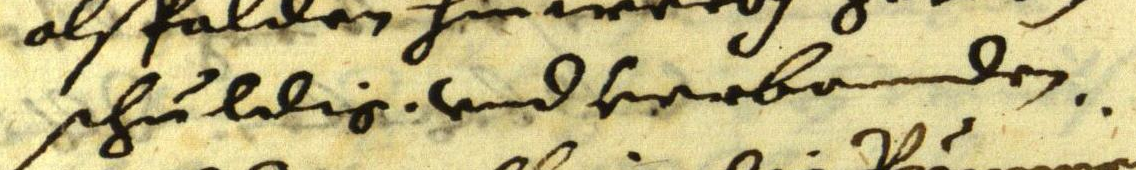schūldig. vnd verbonnden¬
